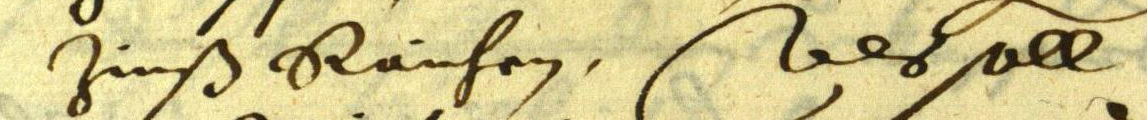Zinß Raichen. Als soll
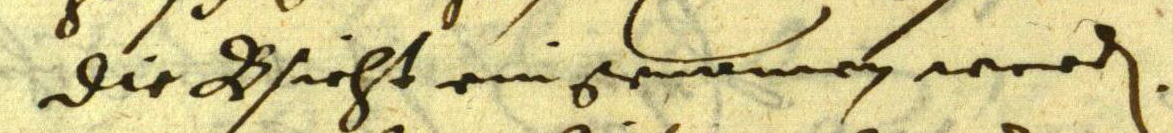die Bsicht ein genomen werd.
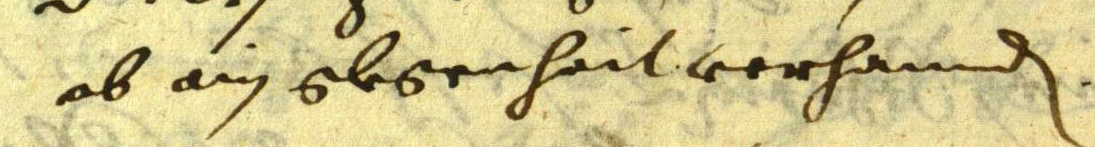ob ain glegenhait verhannd.
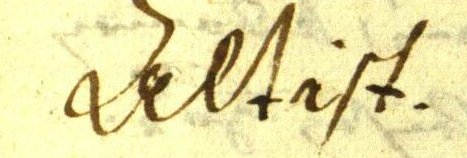Altist.
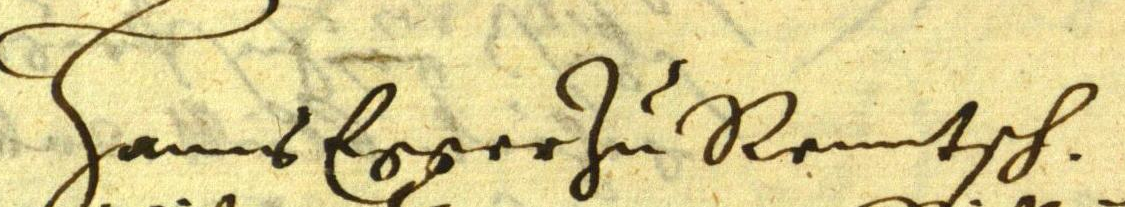Hanns Egger Zū Renntsch.
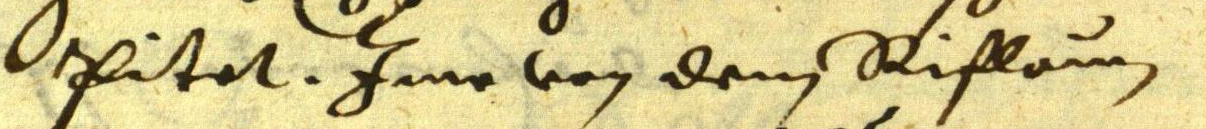Pitet. Ime von dem Riflaūn
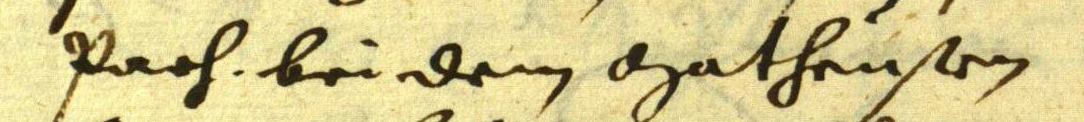Pach. bei dem Matheūsen
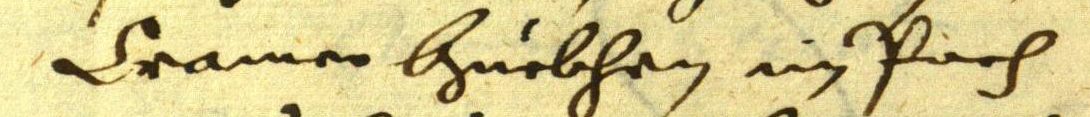Cramer Hūckhen im Pach
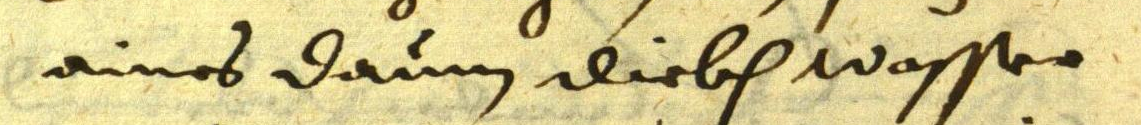aines Daūm dickh wasser
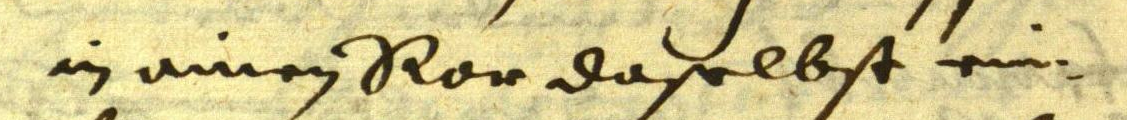in ainen Ror daselbst ein¬
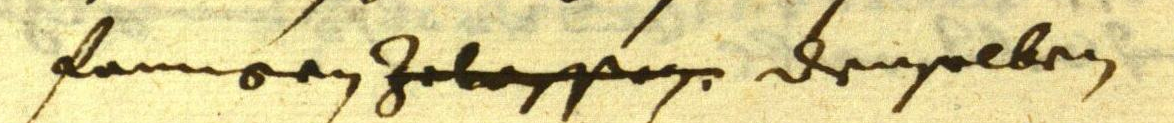fanngen Zelassen. denselben
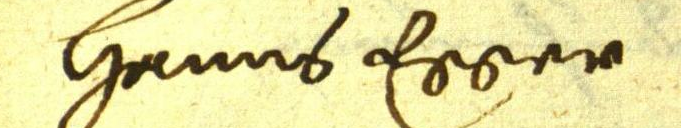Hanns Egger
